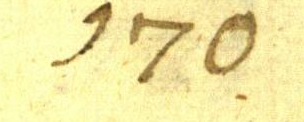170
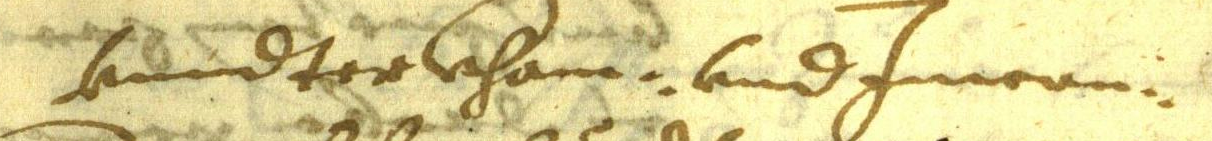vnndter khom: vnd Inwon¬
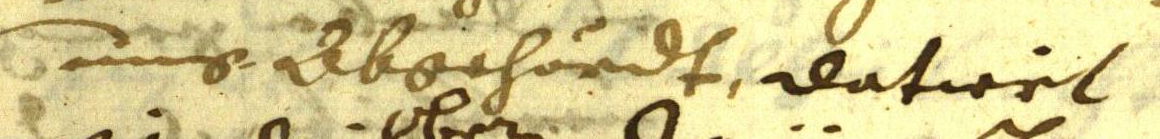ūng. Abgehördt, datiert
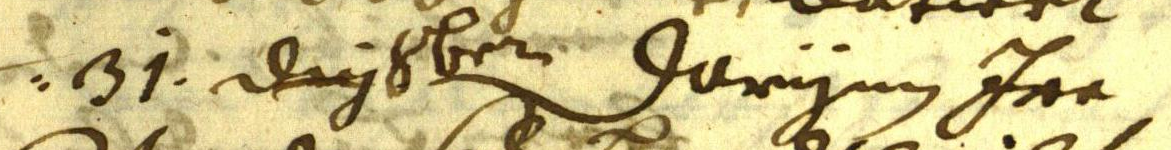:31. diz october. Darÿnn Ire
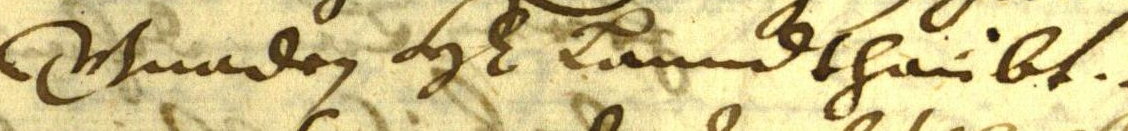Gnaden Hl Lanndhaūbt¬
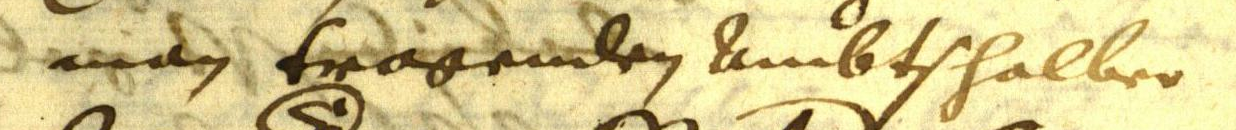man tragenden Ambtshalber
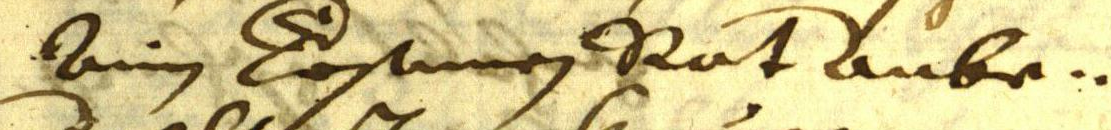Aim Ersamen Rat Anbe¬
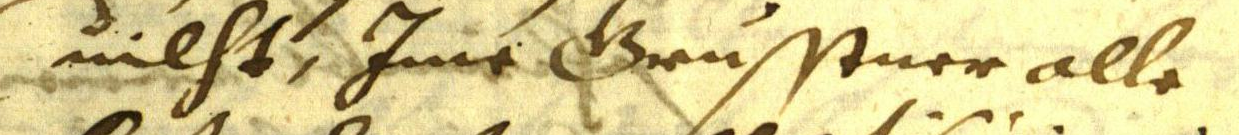vilht, Ime Grūesstner alle
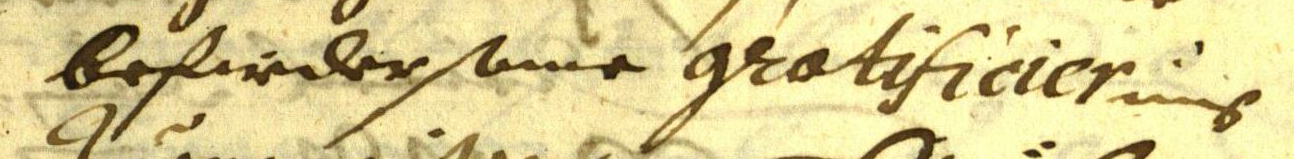befirdersame gratificierūng
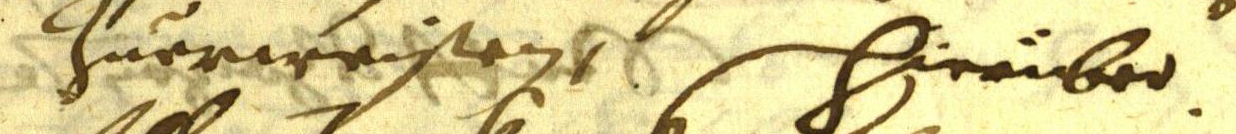Zūerweisen. Hieriber
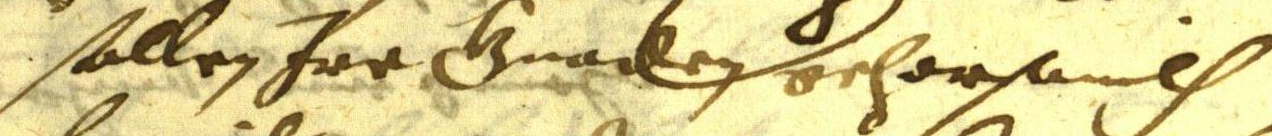sollen Ire Gnaden gehorsamlich
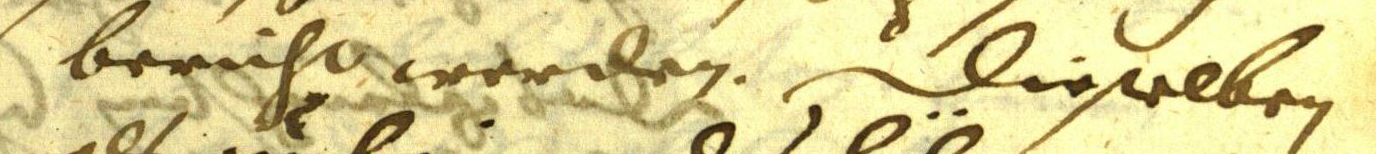bericht werden. Dieselben
